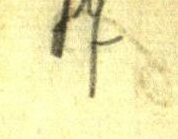17
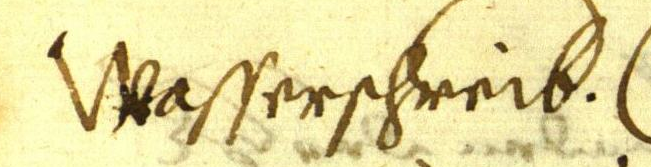Wasserschreib.
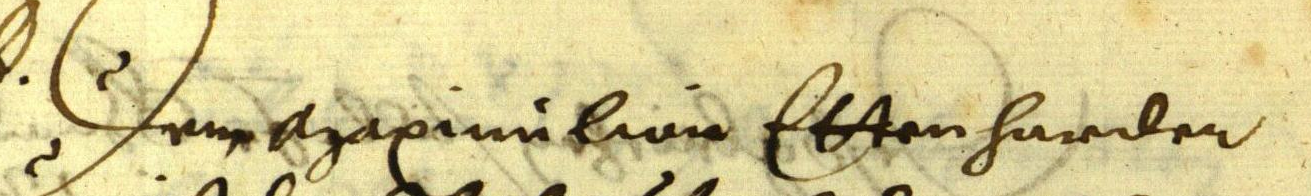Dem Maximilian Ettenharden
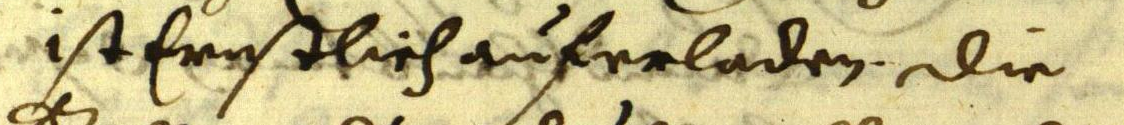ist Ernstlich aūferladen. die
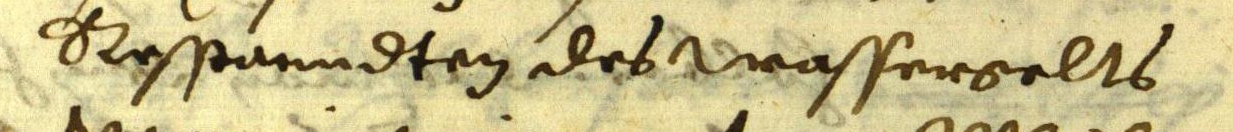Resstanndten des Wassergelts
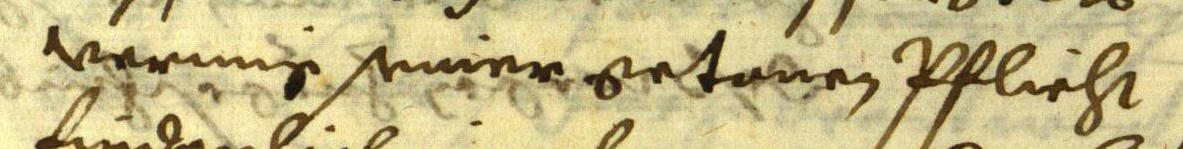vermig seiner getanen Pflicht
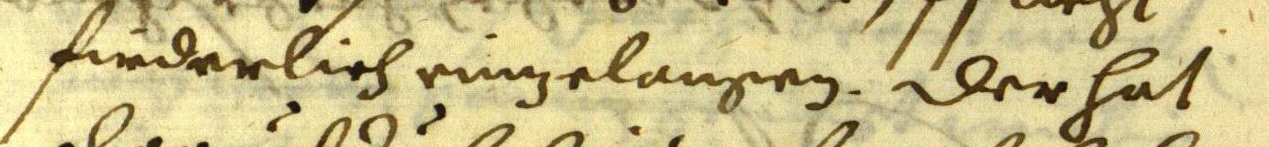firderlich einzelangen. der hat
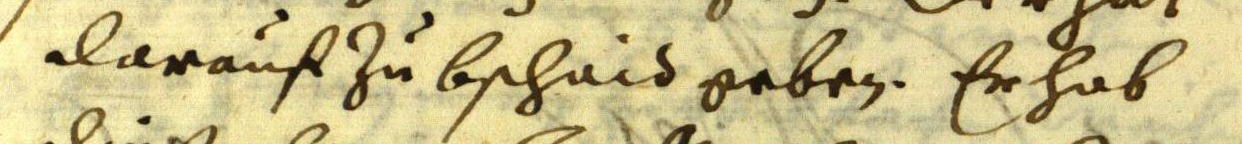daraūf Zū bschaid geben. Er hab
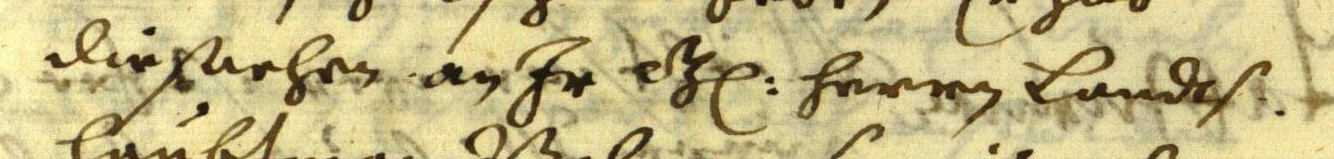die sachen an Ir G: herrn Landts¬
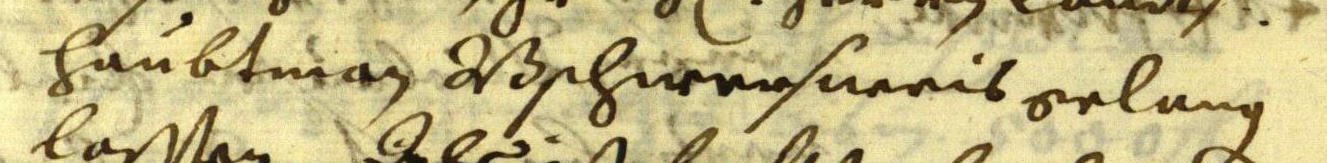haūbtman Bschwersweis gelang
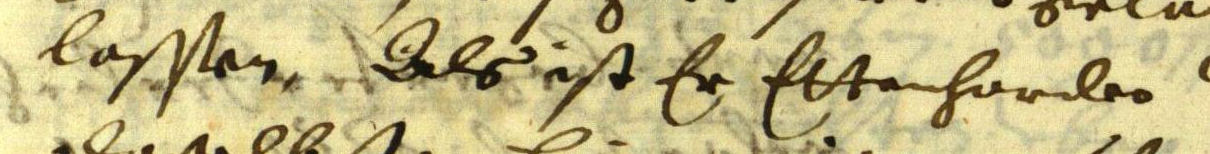lassen, Als ist Er Ettenharder
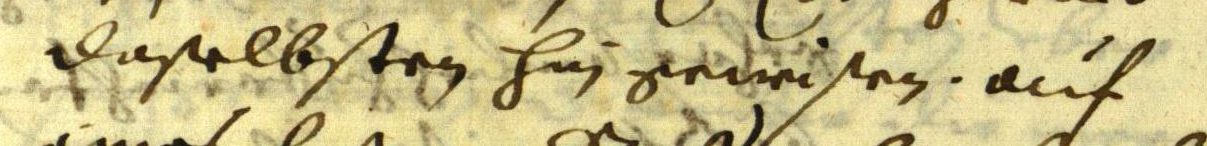daselbsten hin gewisen. aūf
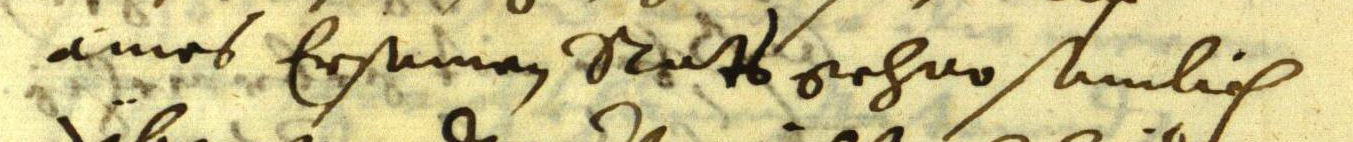aines Ersamen Rats gehorsamlich
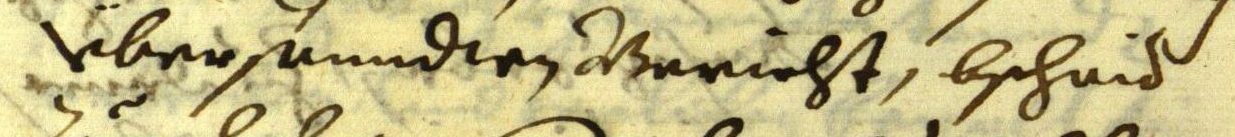v̈bersanndten Bericht, bschaid
